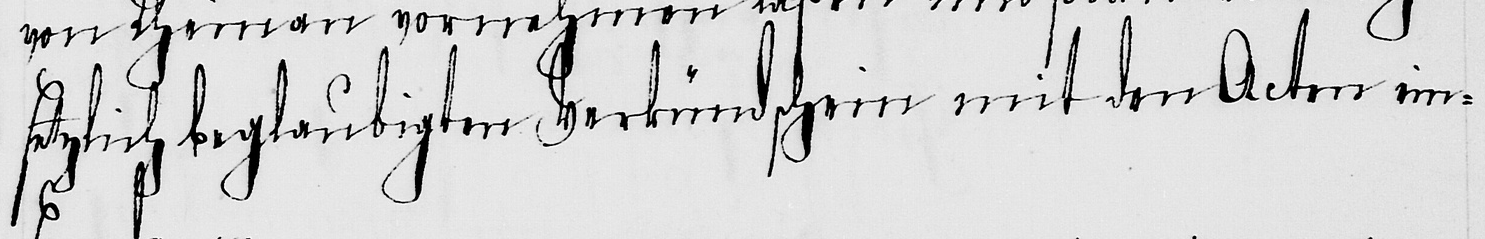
etzlich beglaubigten Verkündschein mit den Acten ein¬
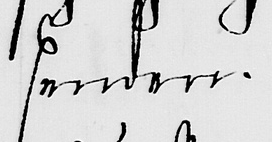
senden.
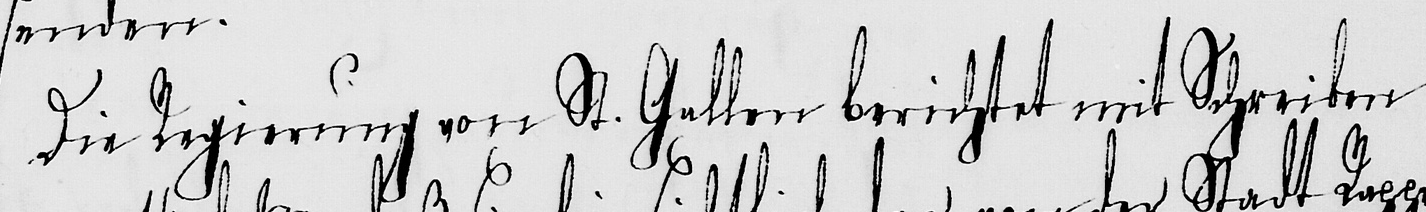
Die Regierung von St. Gallen berichtet mit Schreiben
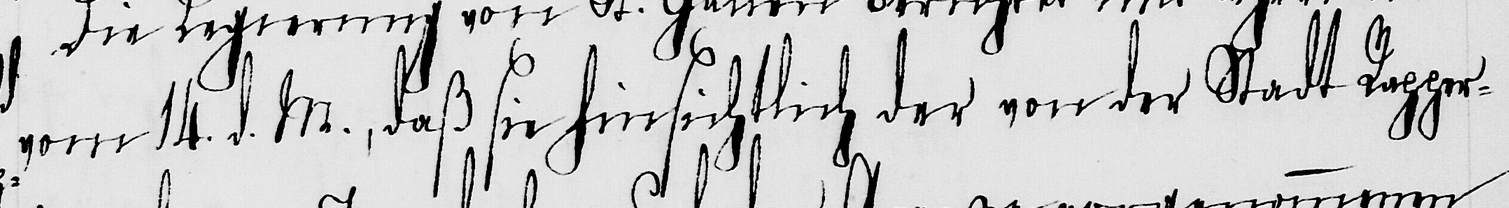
vom 14. d. M., daß sie hinsichtlich der von der Stadt Rappe¬
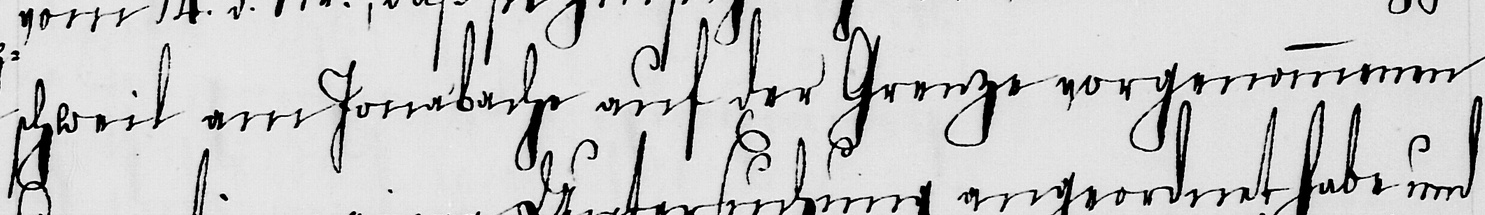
schweil am Jonabache auf der Grenze vorgenommenen
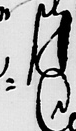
r¬
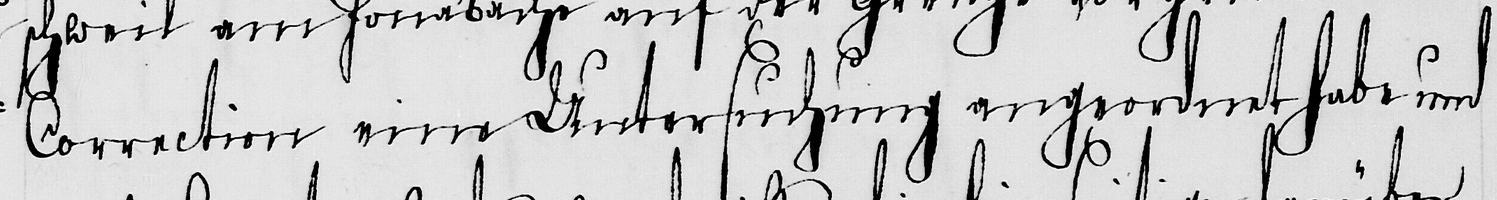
Correction eine Untersuchung angeordnet habe und
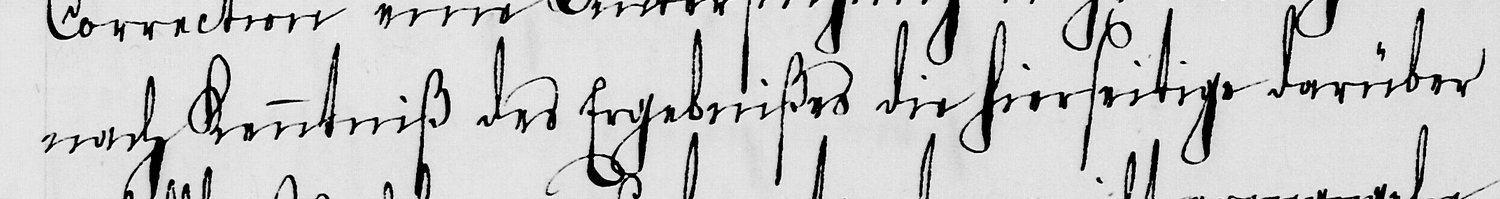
nach Kenntniß des Ergebnißes die hierseitige darüber
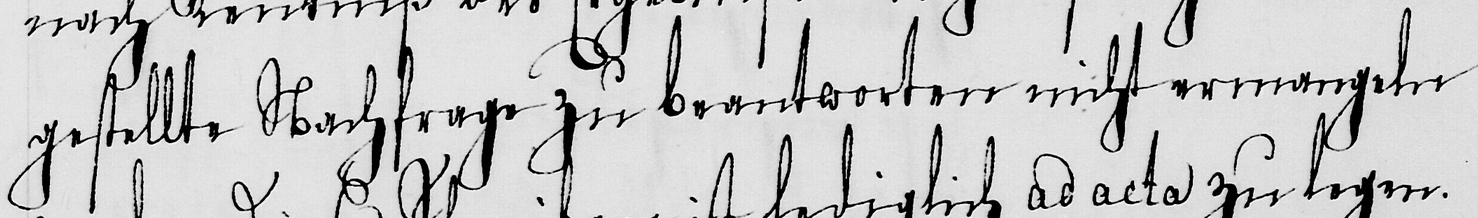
gestellte Nachfrage zu beantworten nicht vermangeln
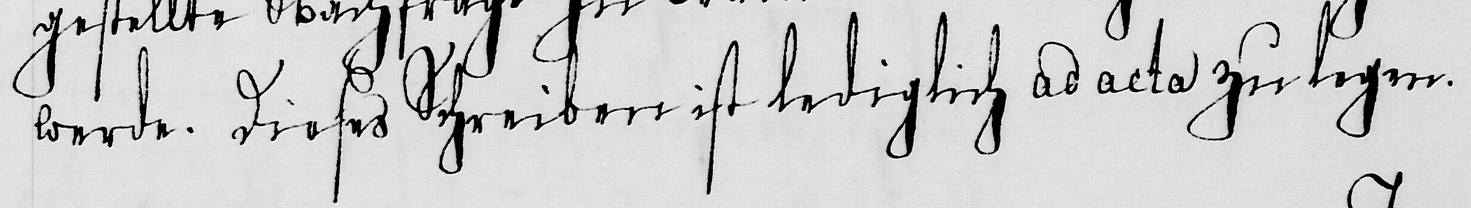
werde. Dieses Schreiben ist lediglich ad acta zu legen.
